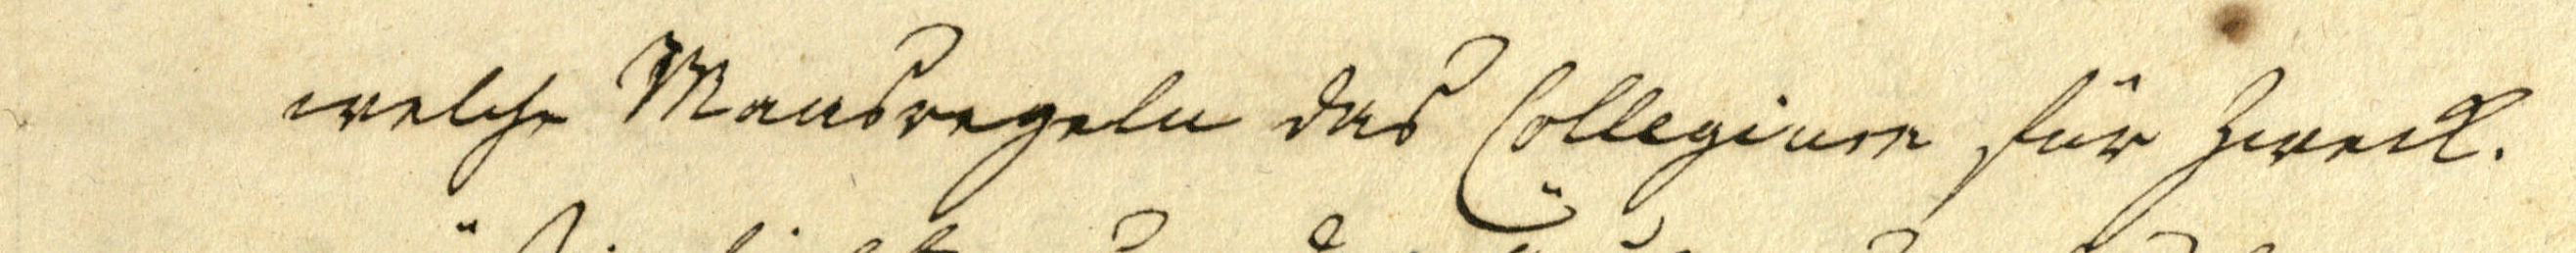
welche Maasregeln das Collegium für Zweck¬
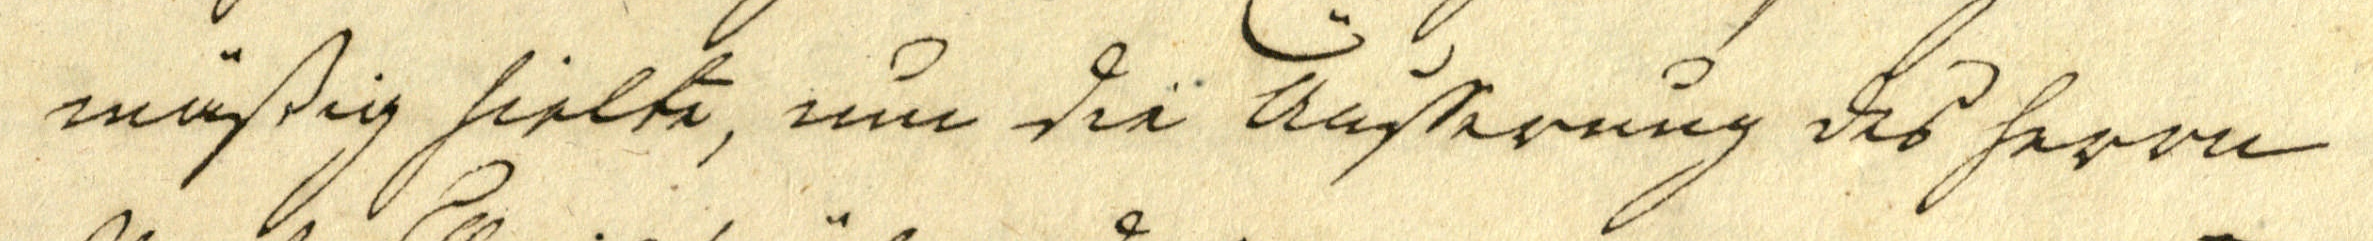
mäßig hielte, um die Äusserung des herrn
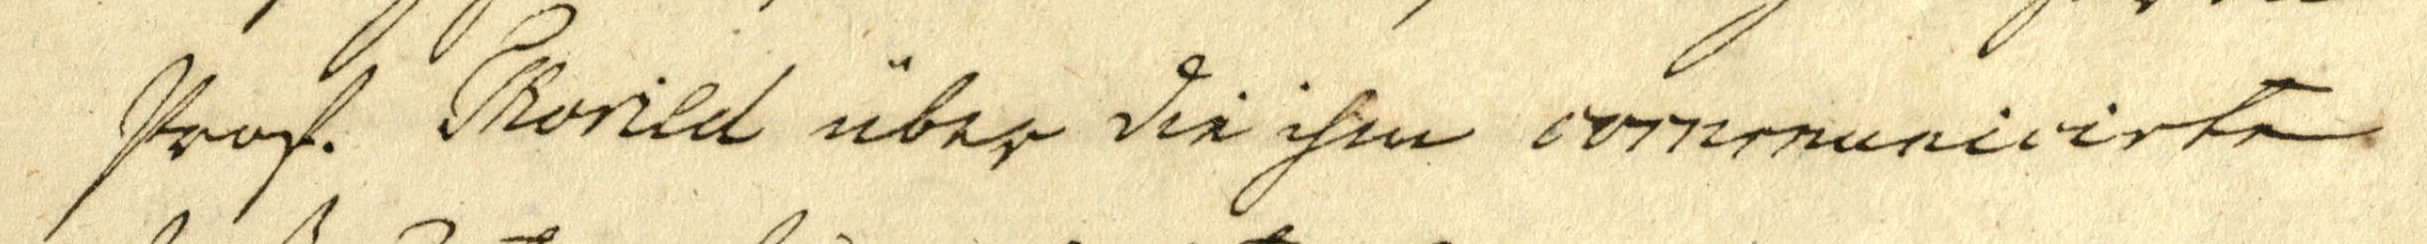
Prof. Thorild über die ihm communicirte
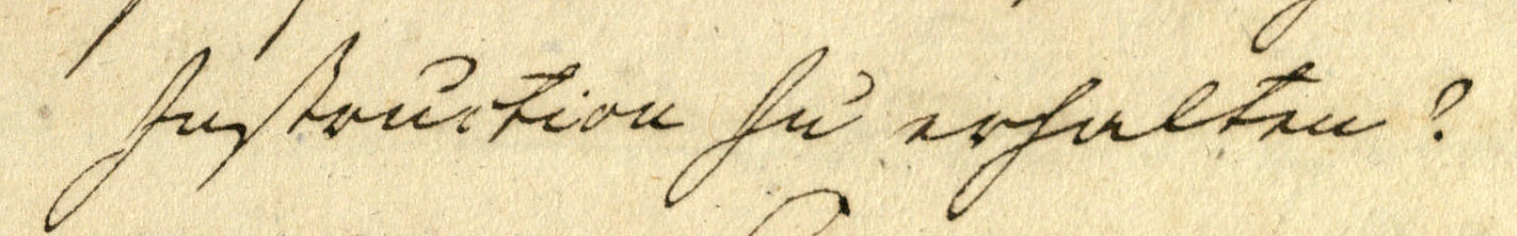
Instruction zu erhalten?
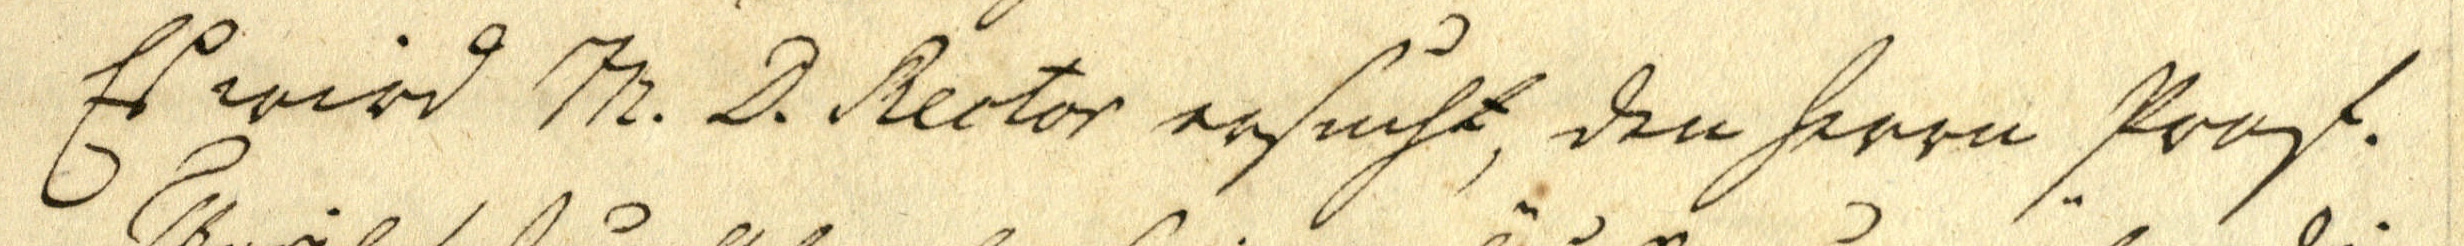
Es wird M. D. Rector ersucht, den herrn Prof.
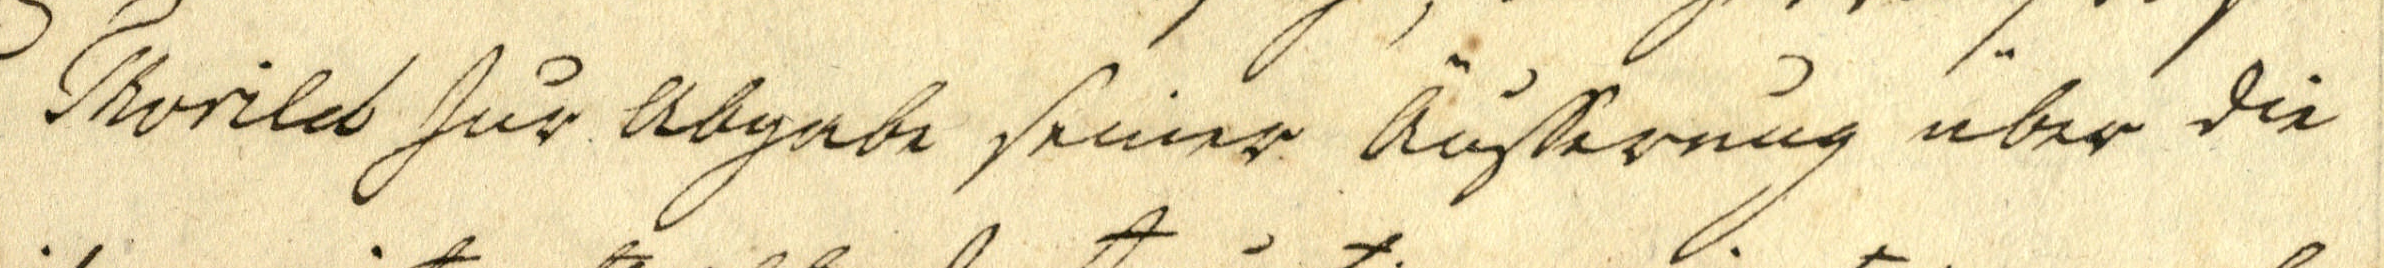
Thorild Zur Abgabe seiner Äusserung über die
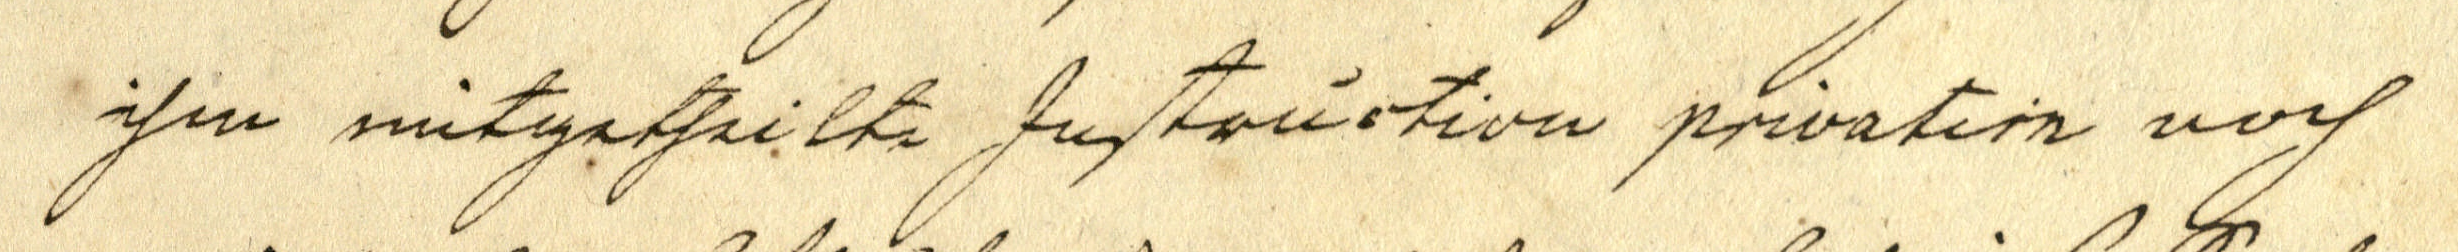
ihm mitgetheilte Instruction privatim noch
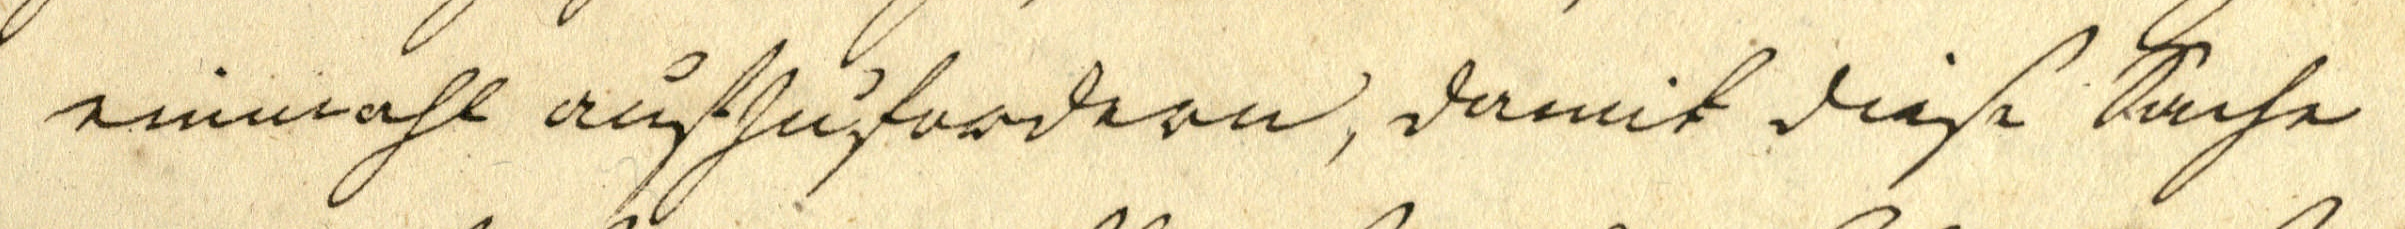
einmahl aufzufordern, damit diese Sache
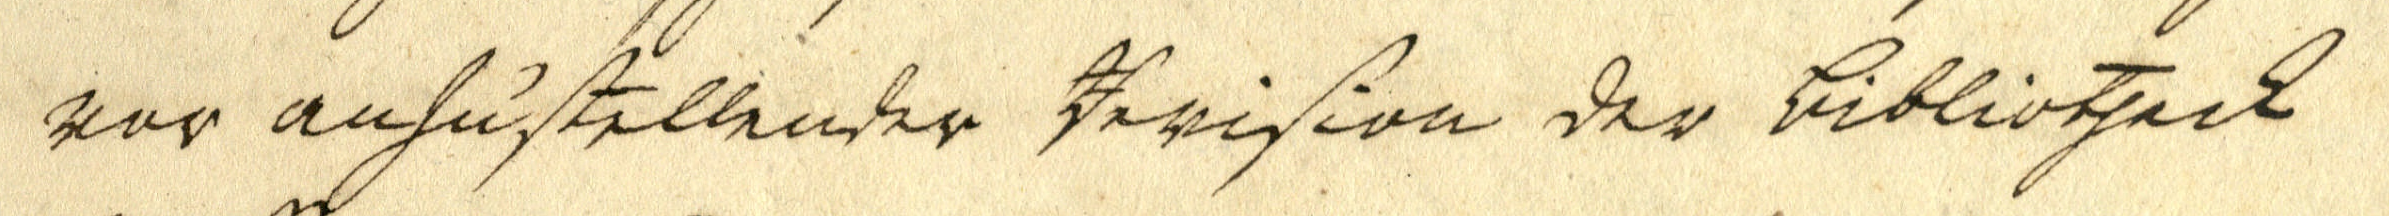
vor anzustellender Revision der Bibliotheck
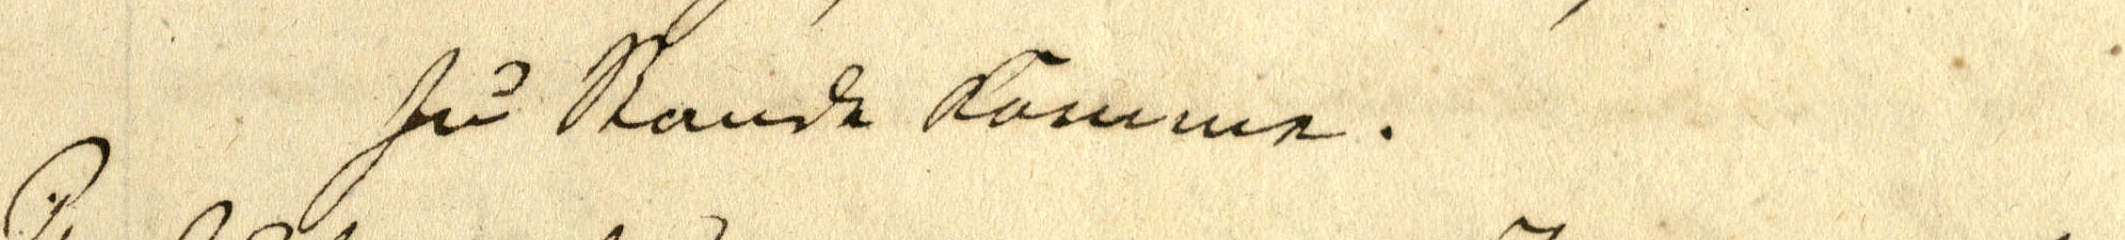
zu Stande komme.
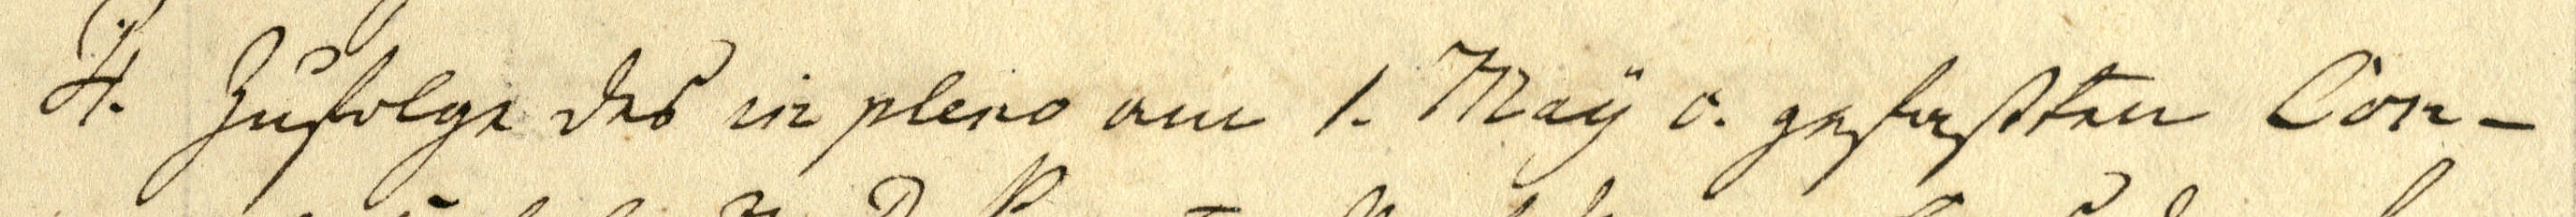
4. Zufolge des in pleno am 1. Maÿ c. gefaßten Con¬
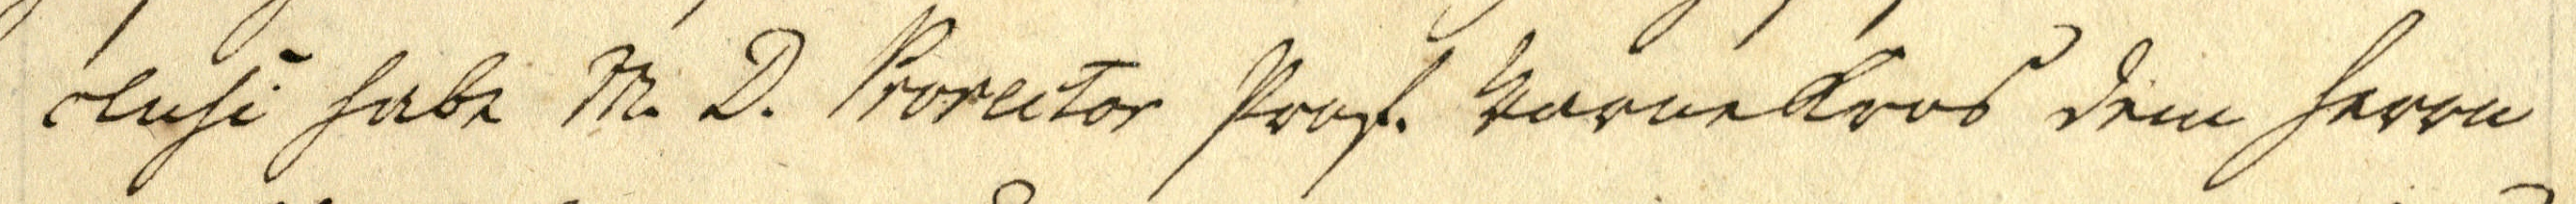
clusi habe M. D. Prorector Prof. Warnekros dem herrn
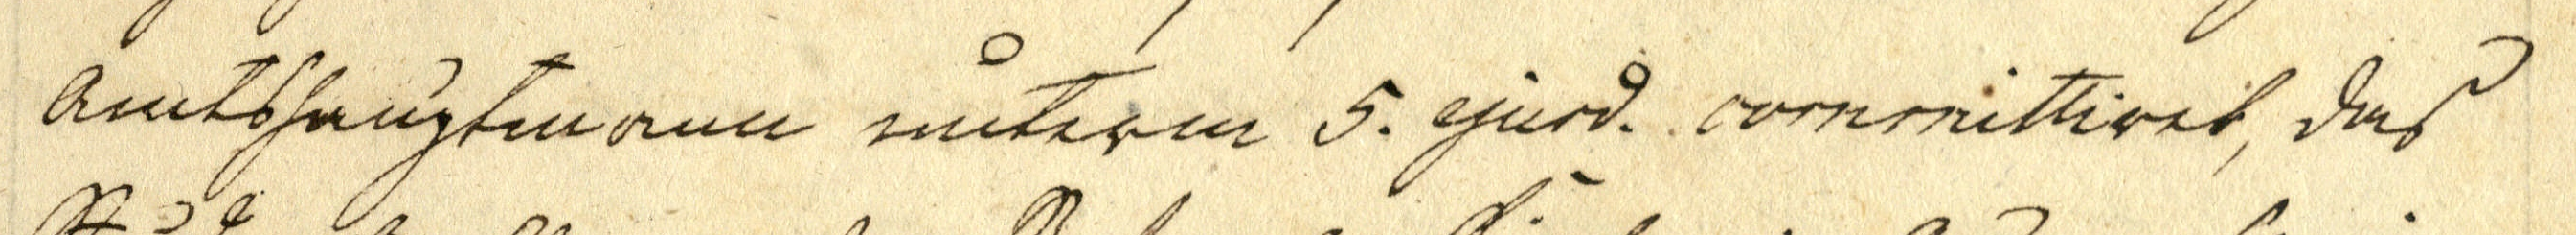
Amtshauptmann unterm 5. ejusd. committiret, das
